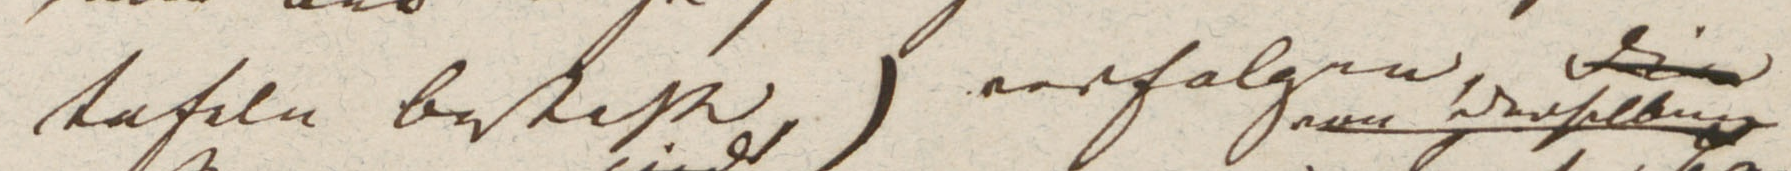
tafeln besteht) verfolgen, die
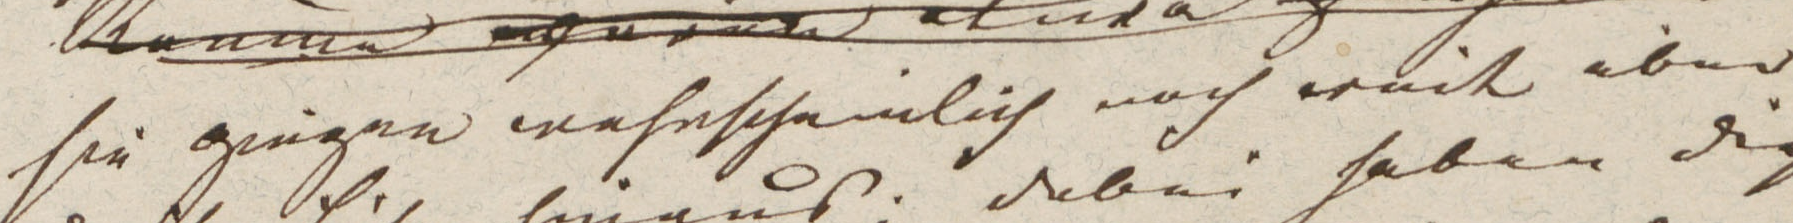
sie gingen wahrscheinlich noch weit über
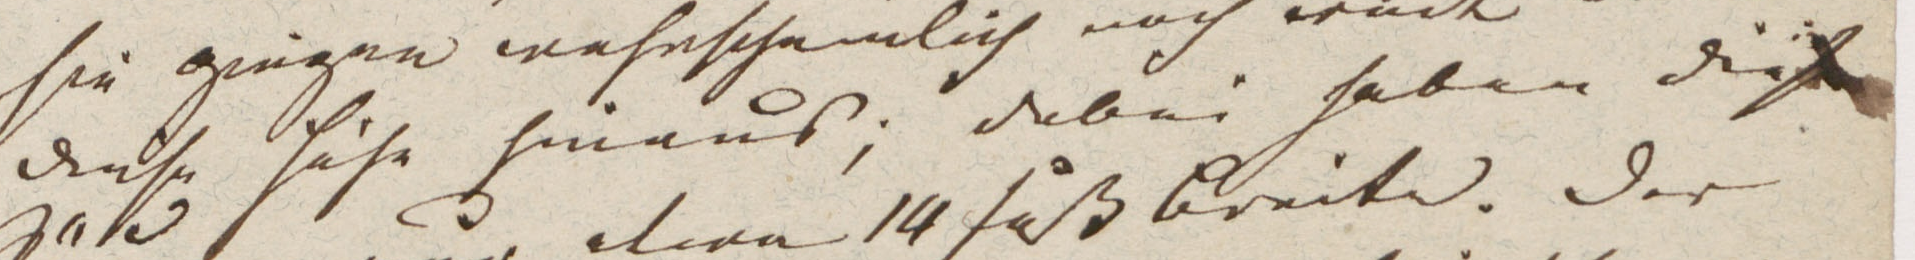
diese Höhe hinaus; dabei haben diese
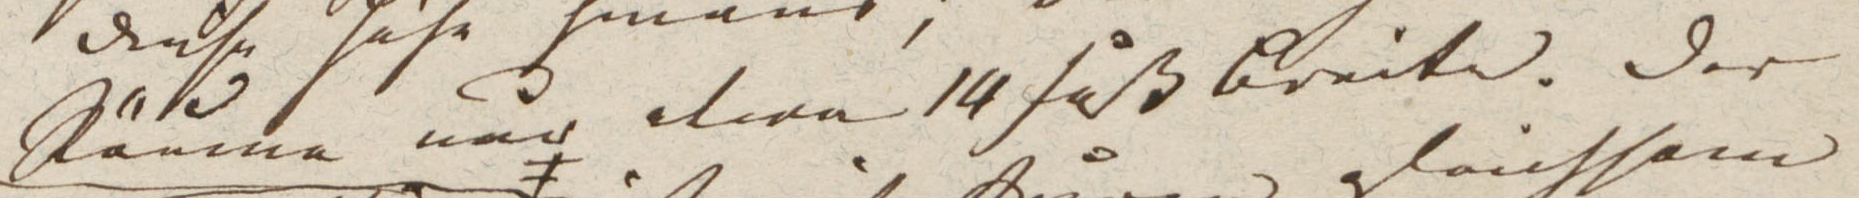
Räume nur etwa 14 Fuss Breite. Der
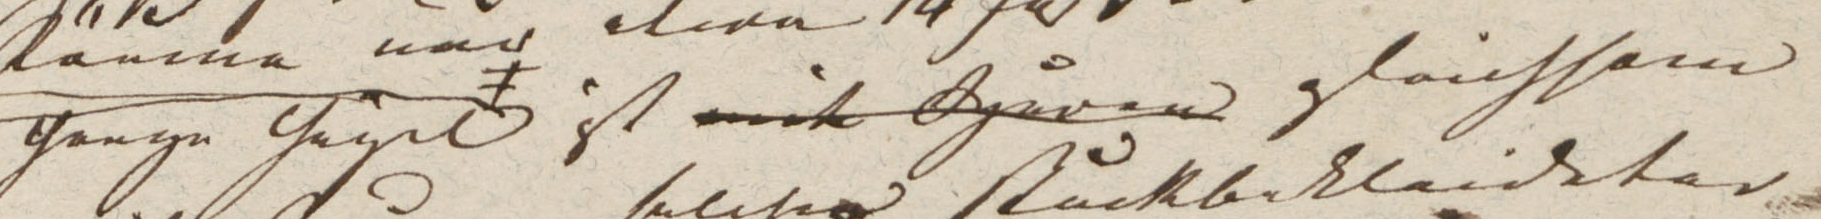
ganze Hügel % ist mit Spuren gleichsam
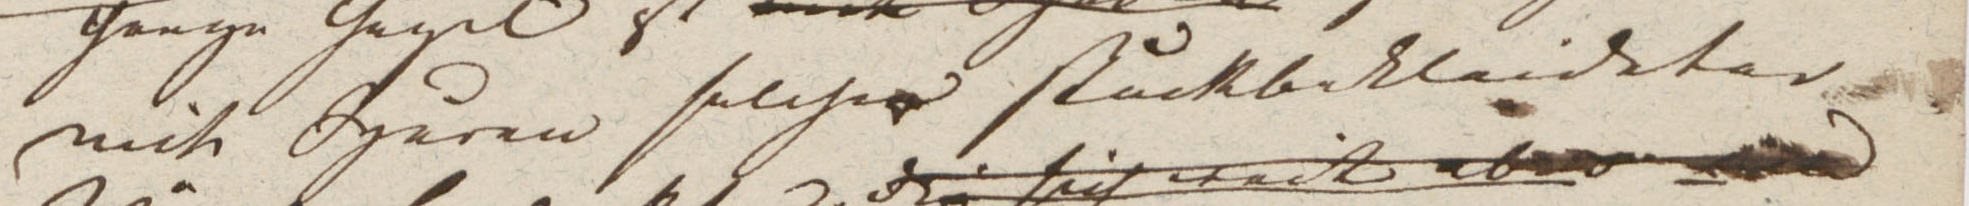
mit Spuren solchenr stuckbekleideter
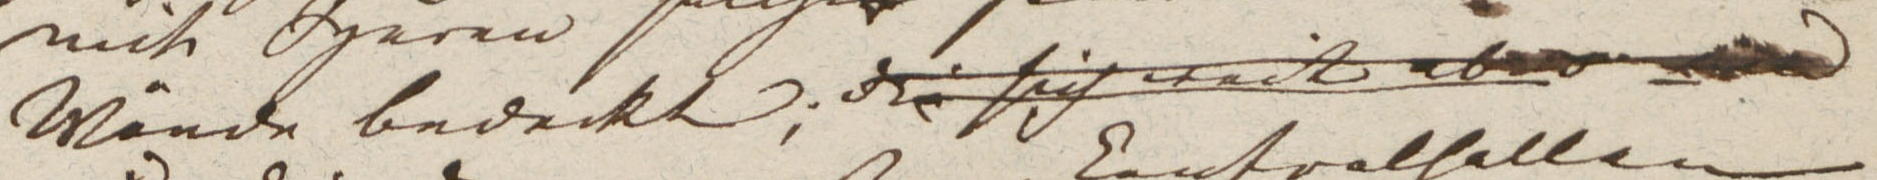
Wände bedeckt; die sich weit über und
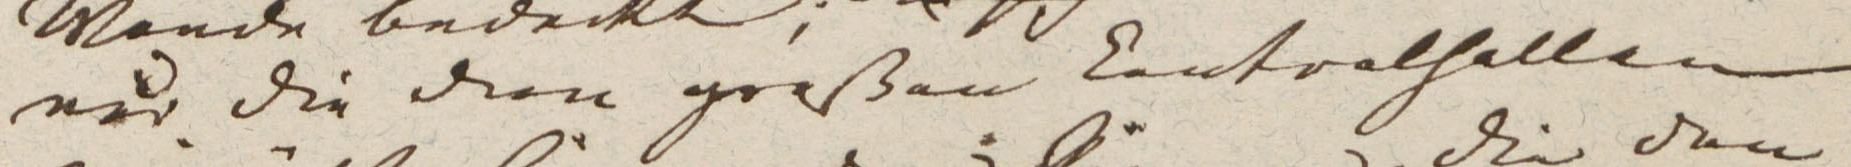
nur die den grossen Centralhallen
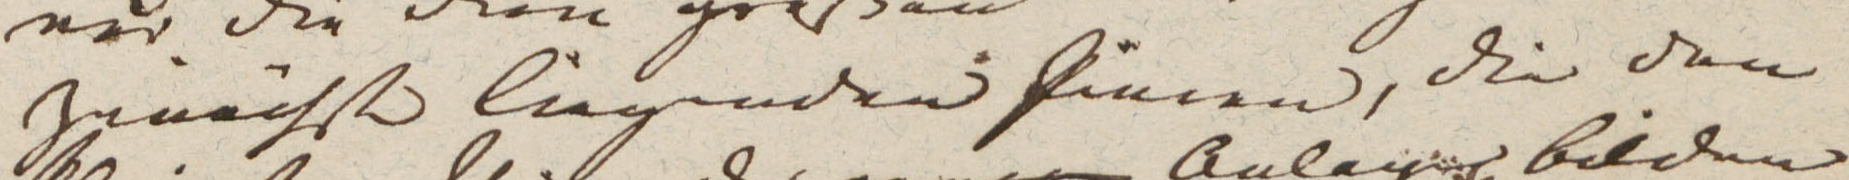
zunächst liegenden Piecen, die den
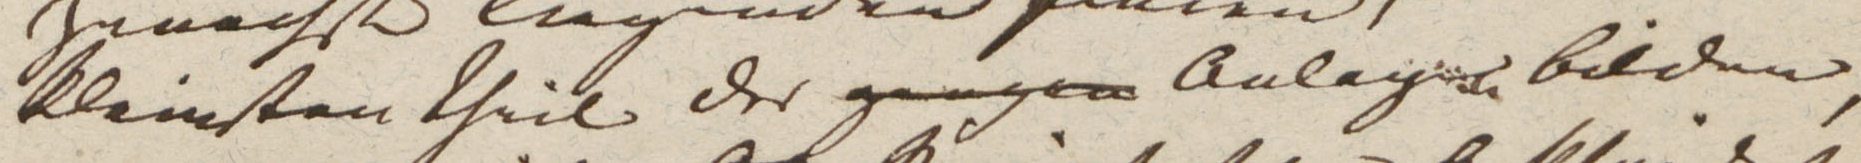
kleinsten Theil der ganzen Anlagen bilden,
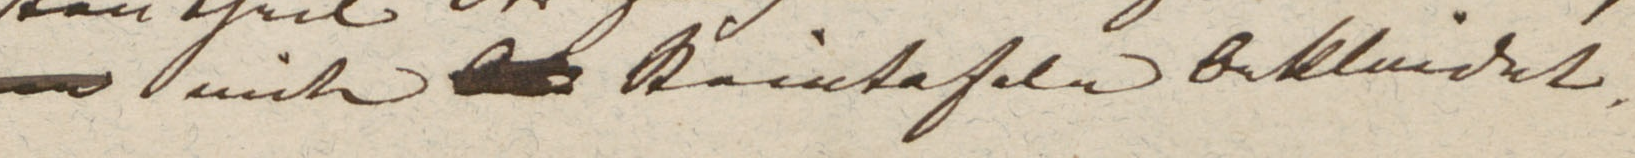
waren mit Steintafeln bekleidet.
